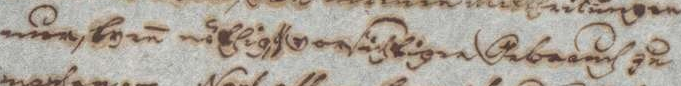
nur, wenn nöthig, & vorsichtigen Gebrauch zu
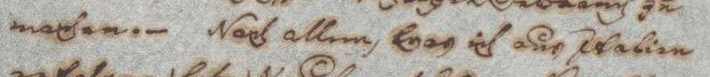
machen. – Nach allem, was ich aus Italien
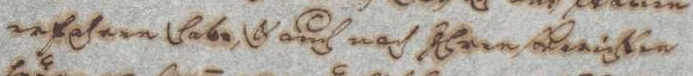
erfahren habe, & auch nach Ihren Berichten
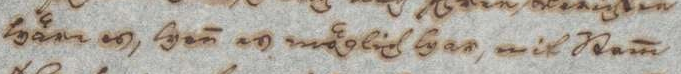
wäre es, wenn es möglich war, mit Stamm
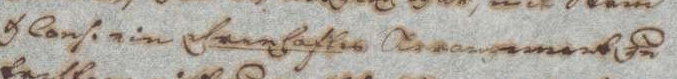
& Cons. ein ehrenhaftes Arrangement zu
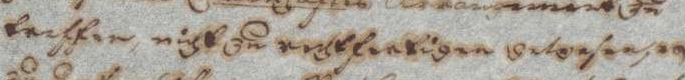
treffen, nicht zu rechtfertigen gewesen, es
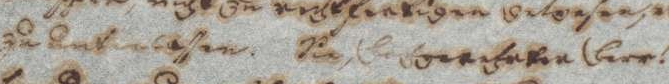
zu unterlassen. Sie, hochverehrter Herr!
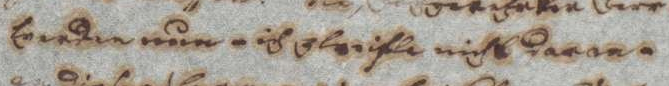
werden nun – ich zweifle nicht daran –
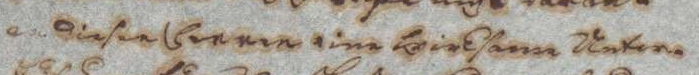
an diesen Herren eine wirksame Unter-
